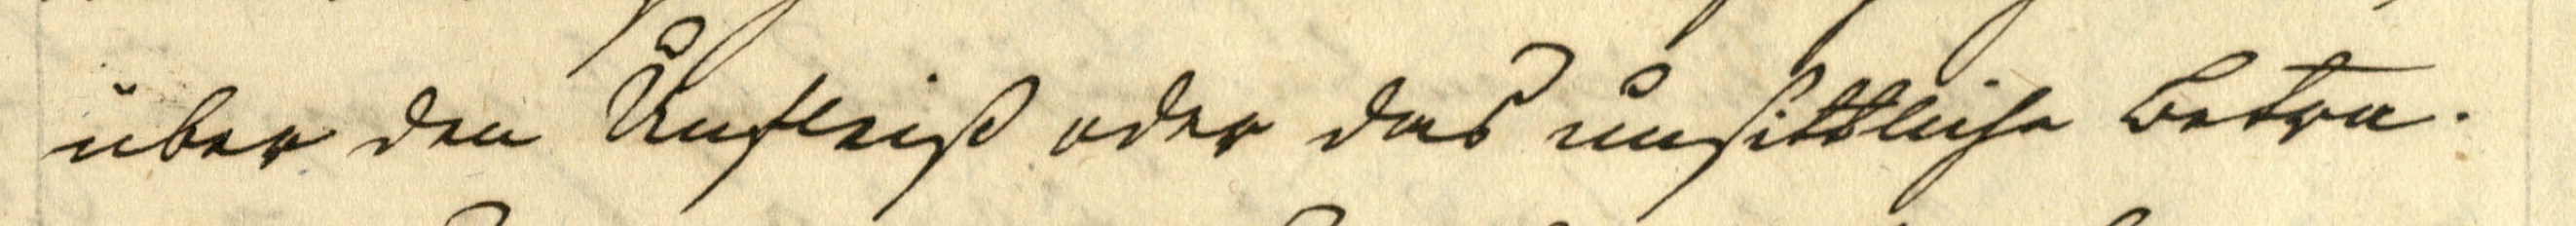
über den Unfleiß oder das unsittliche Betra-
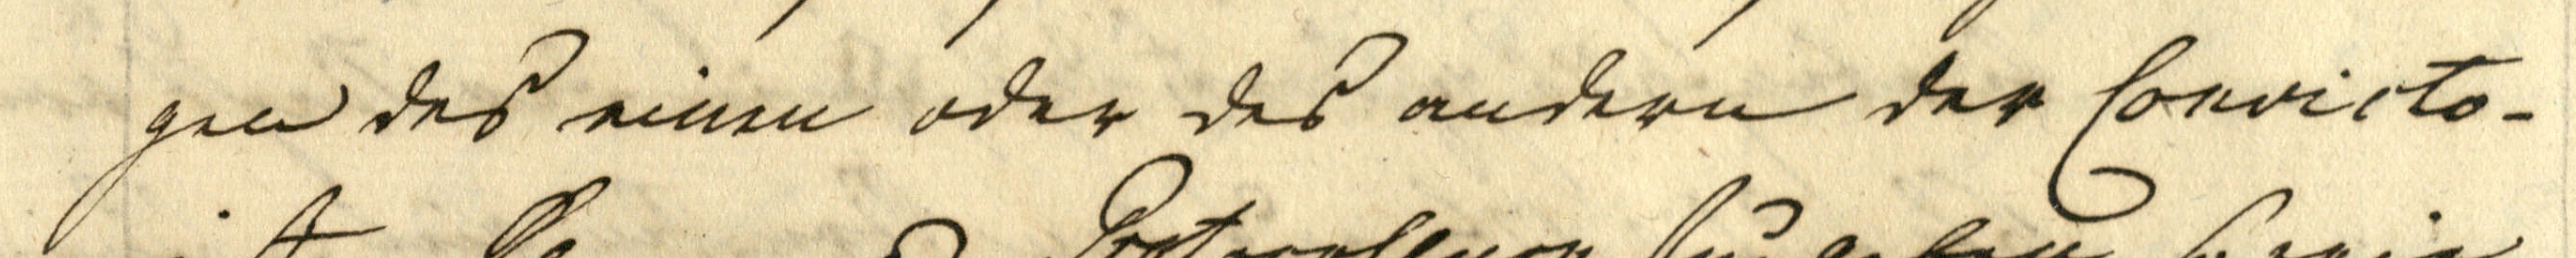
gen des einen oder des andern der Convicto-
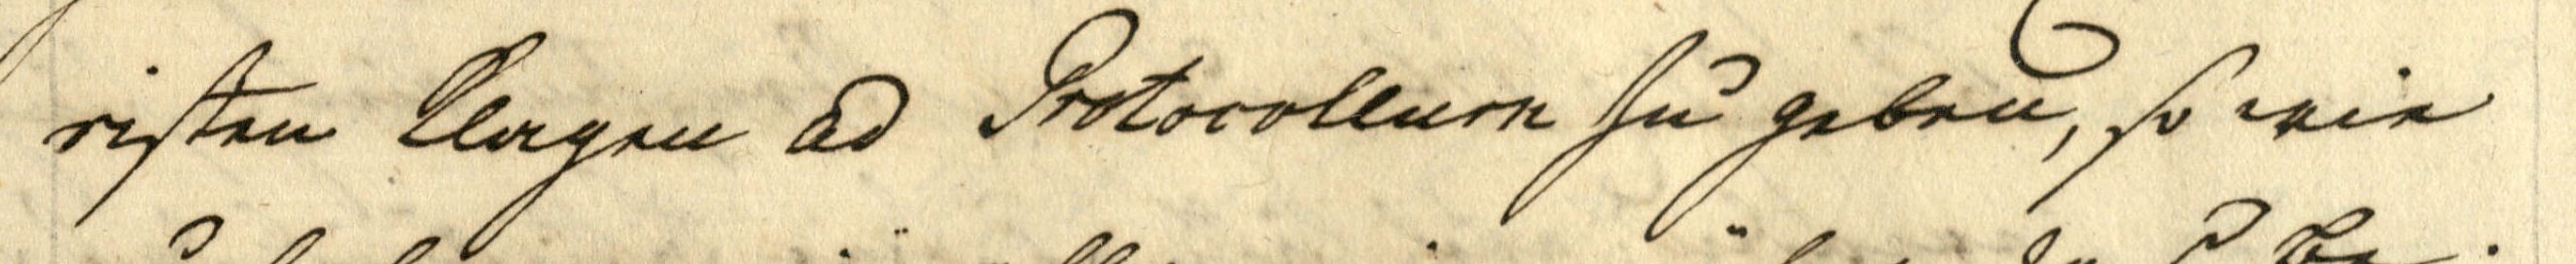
risten Klagen ad Protocollum zu geben, so wie
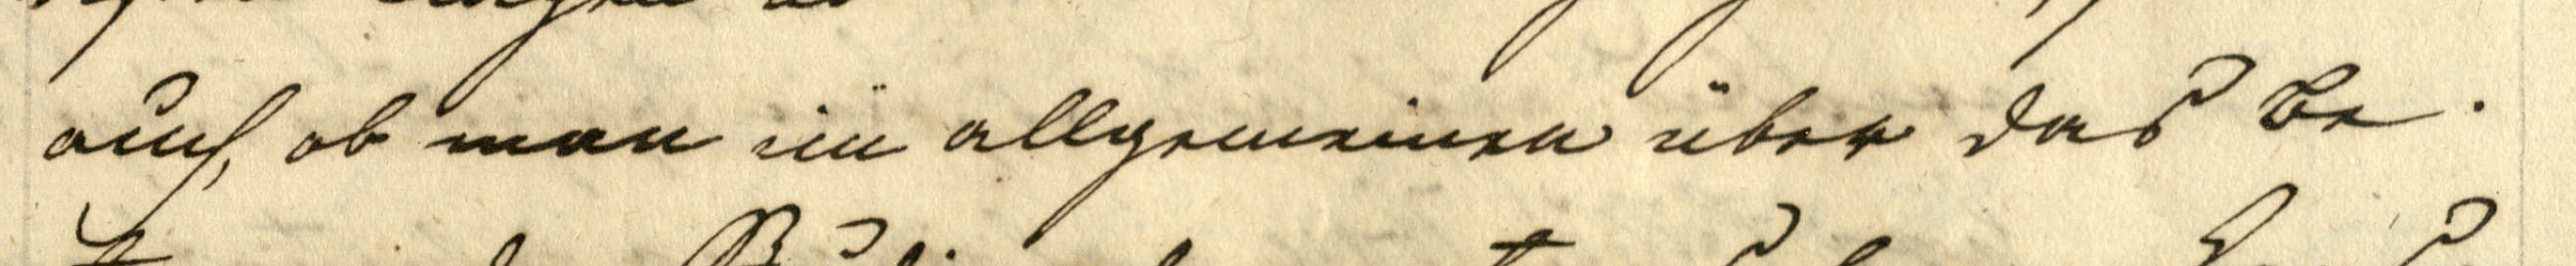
auch ob man im allgemeinen über das Be-
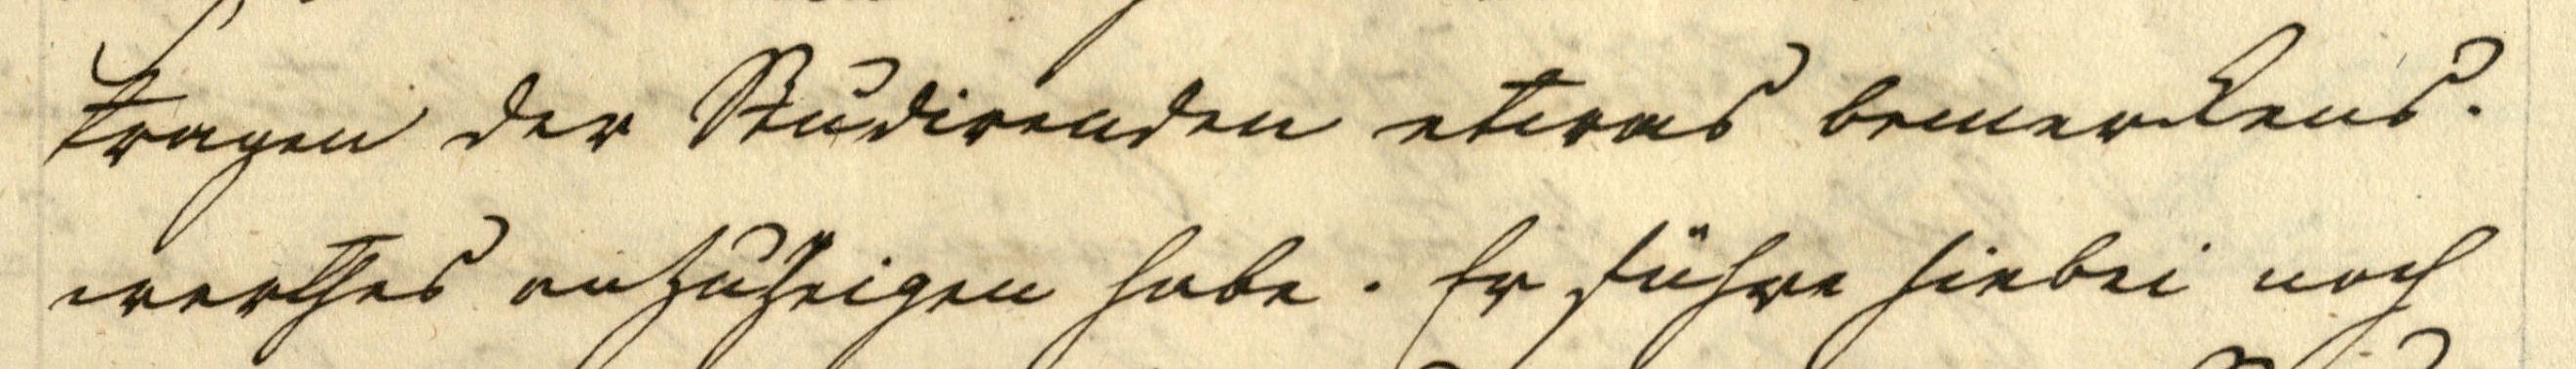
tragen der Studirenden etwas bemerkens-
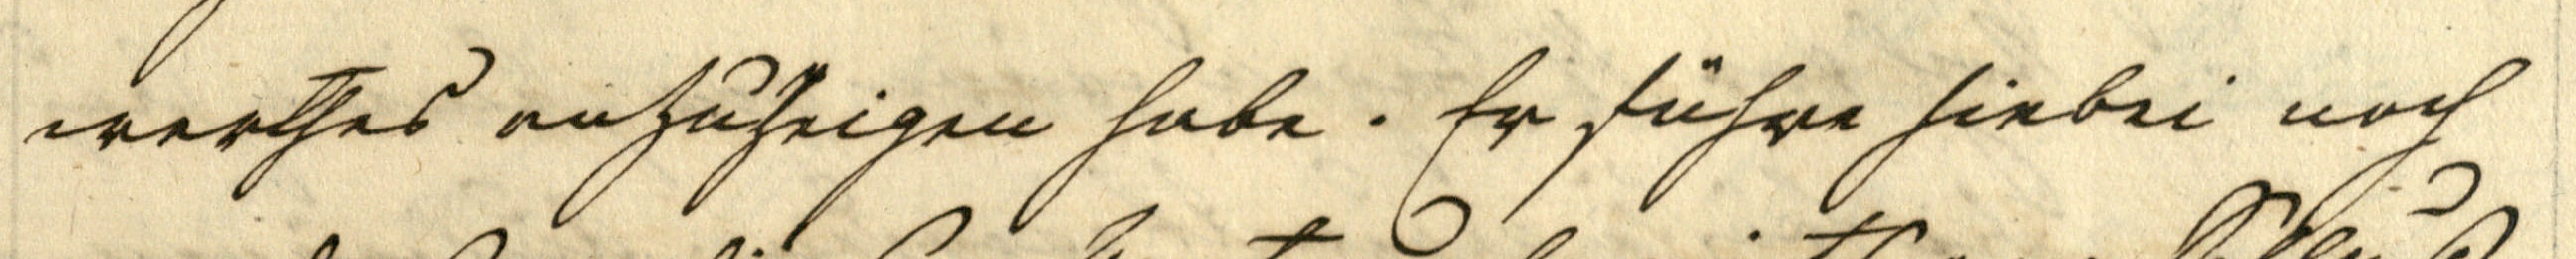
werthes anzuzeigen habe. Er führe hiebei noch
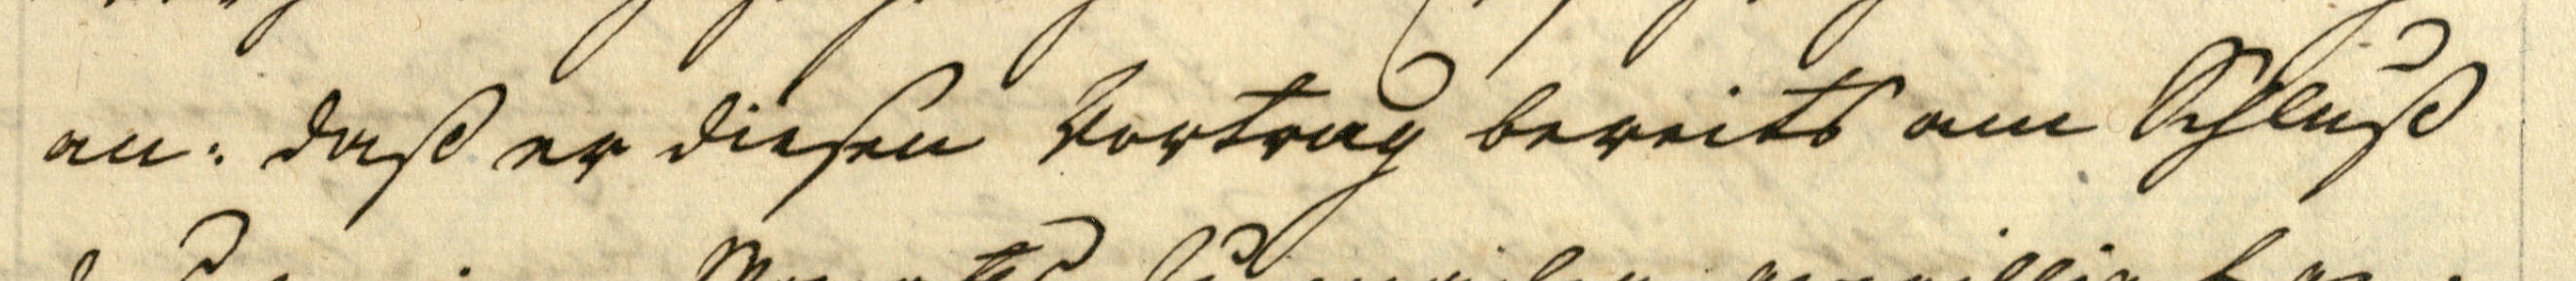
an: daß er diesen Vortrag bereits am Schluß
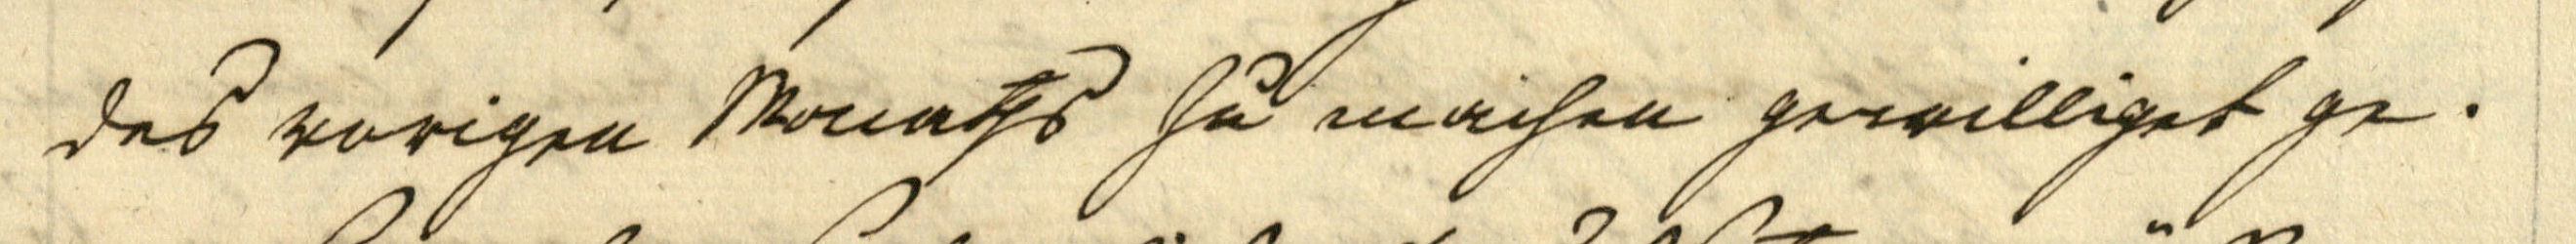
des vorigen Monaths zu machen gewilliget ge-
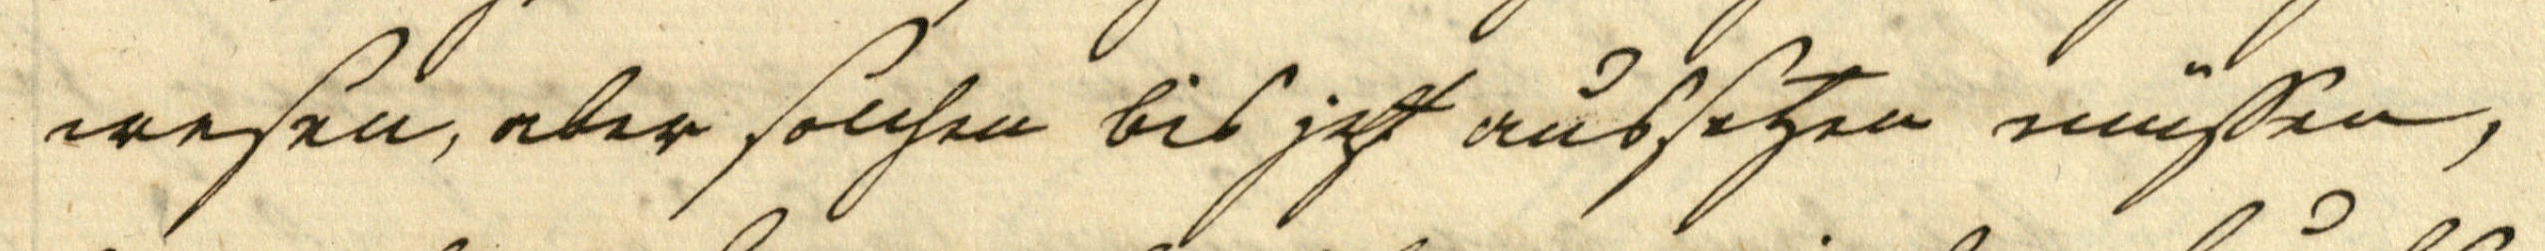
wesen, aber solchen bis jetzt aussetzen müssen,
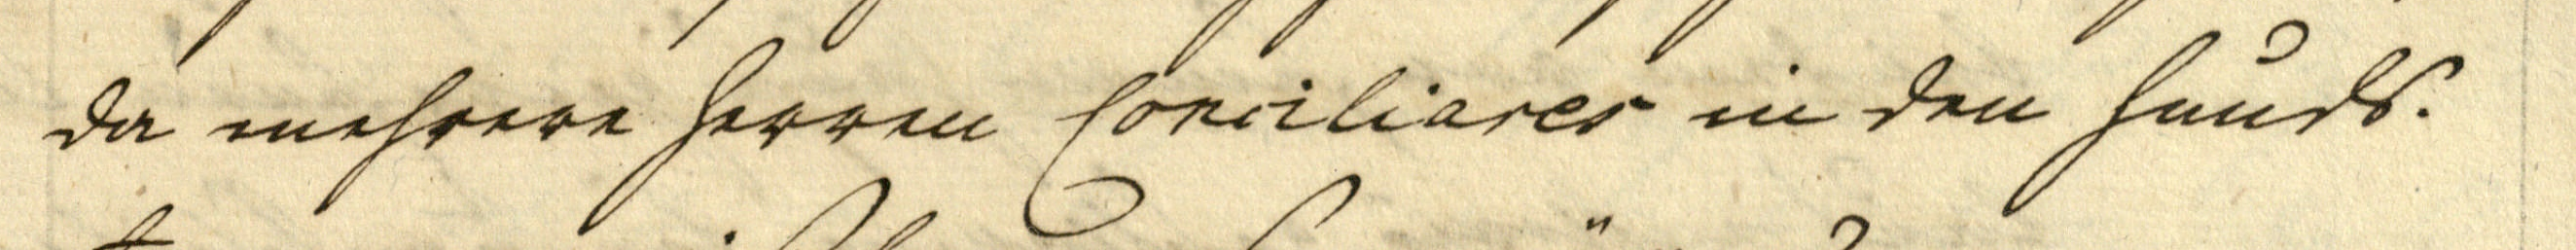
da mehrere Herren Conciliares in den Hunds-
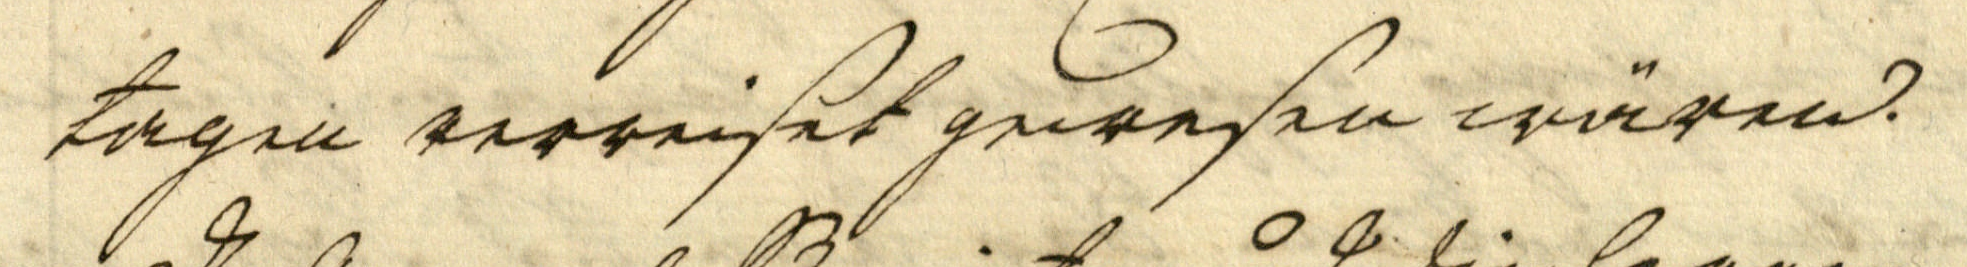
tagen verreiset gewesen wären.
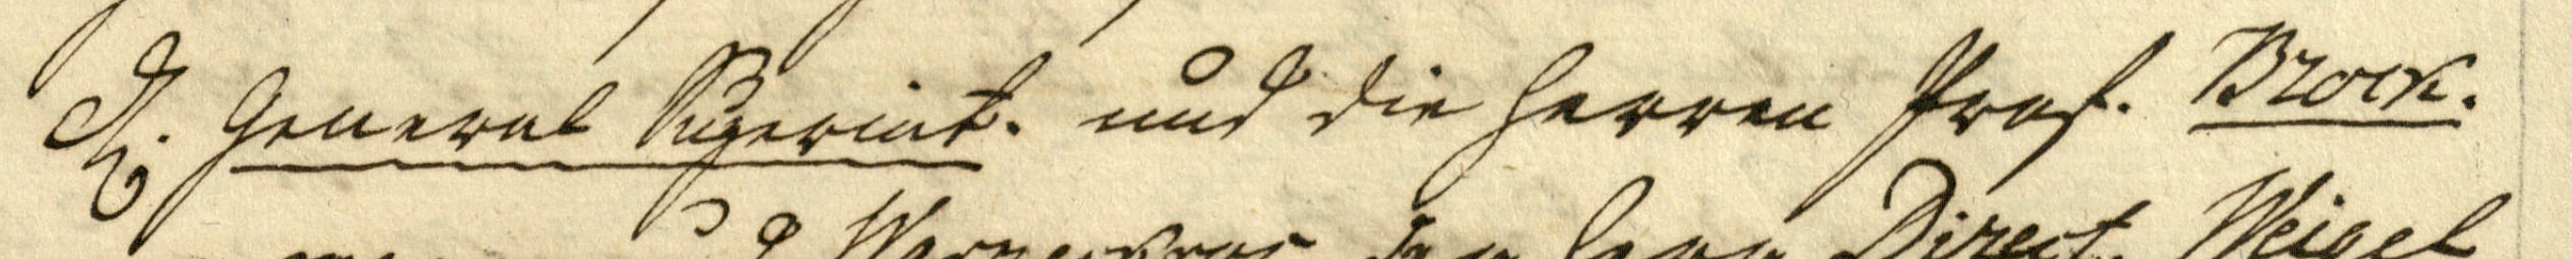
dh. General Superint. und die Herrn Prof. Brock-
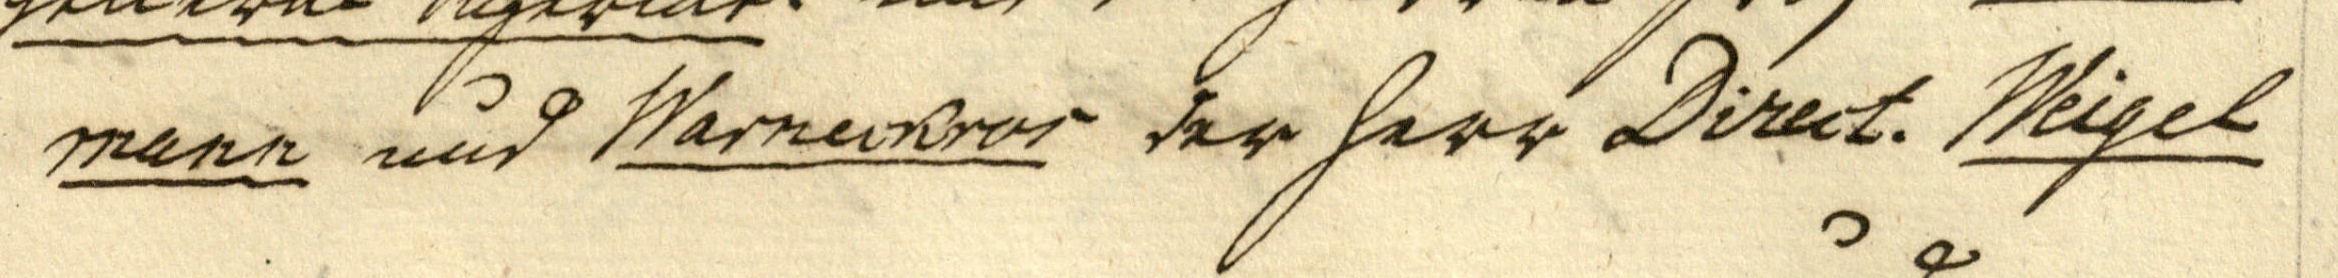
mann und Warneckros der Herr Direct. Weigel
